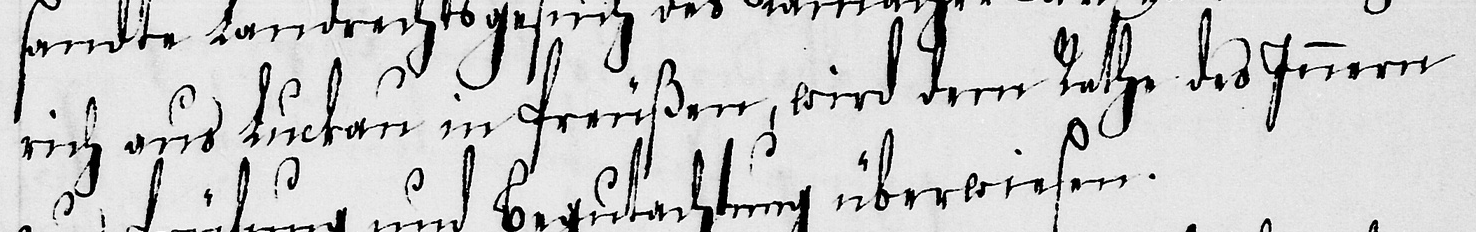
rich aus Luckau in Preußen, wird dem Rathe des Innern
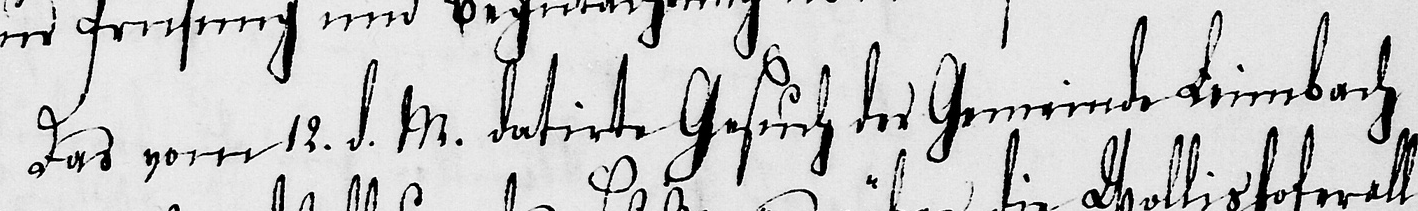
Das vom 12. d. M. datirte Gesuch der Gemeinde Leimbch
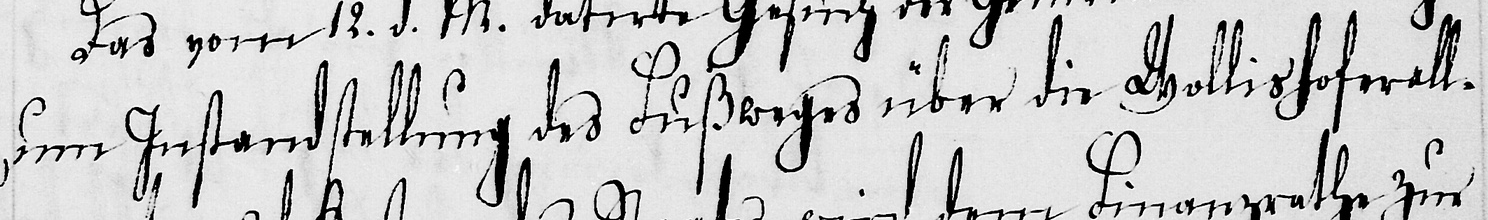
um Instandstellung des Fußweges über die Wollishoferal¬
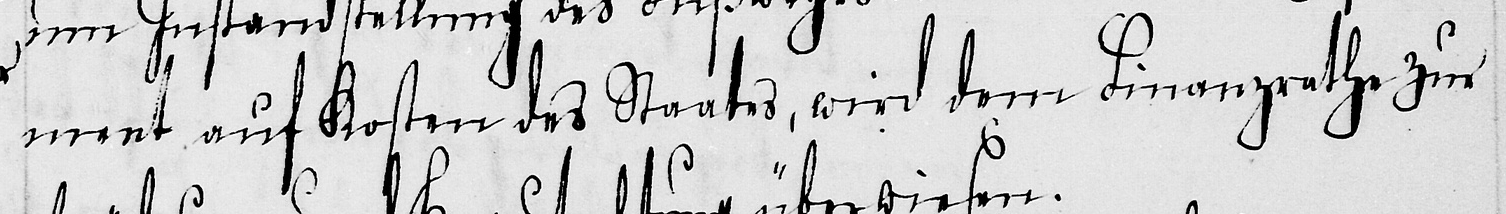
lment auf Kosten des Staates, wird dem Finanzrathe zur
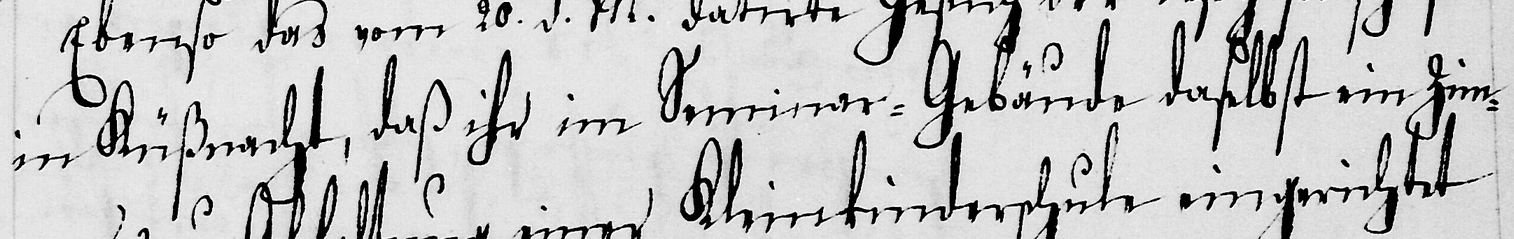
in Küßnacht, daß ihr im Seminar-Gebäude daselbst ein Zi¬
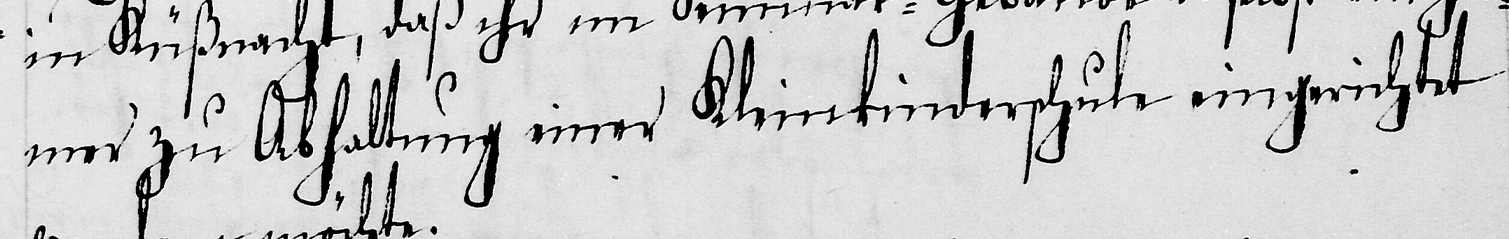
mer zu Abhaltung einer Kleinkinderschule eingerichtet
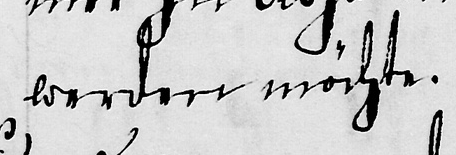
werden möchte.
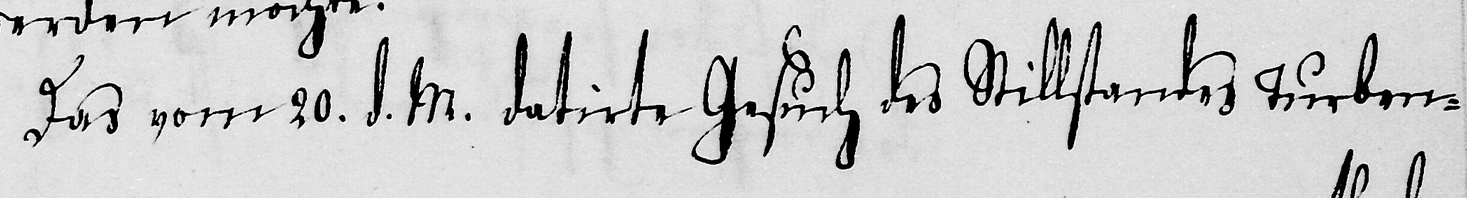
Das vom 20. d. M. datirte Gesuch des Stillstandes Turben-
